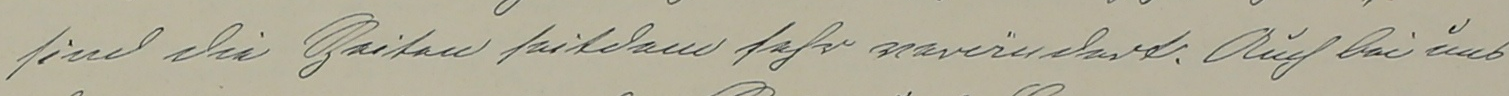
sind die Zeiten seitdem sehr verändert. Auch bei uns
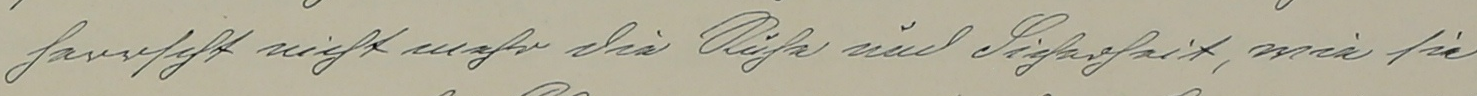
herrscht nicht mehr die Ruhe und Sicherheit, wie sie
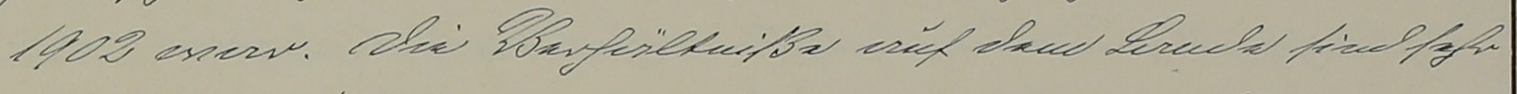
1902 war. Die Verhältniße auf dem Lande sind sehr
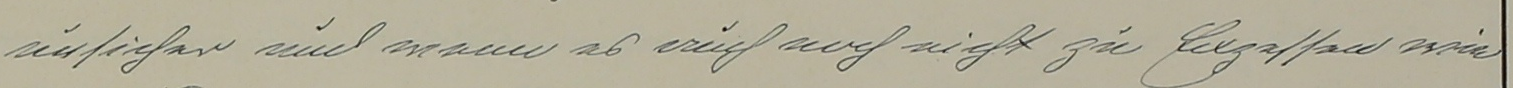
unsicher und wenn es auch noch nicht zu Exzessen wie
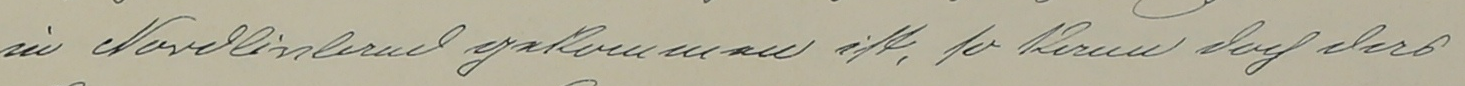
in Nordlivland gekommen ist, so kann doch das
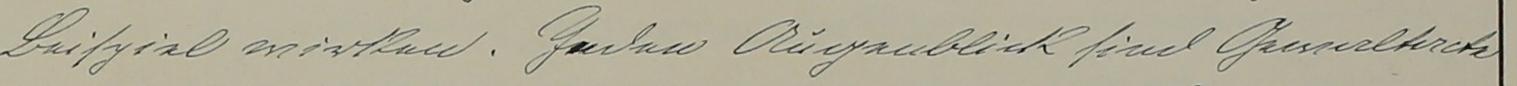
Beispiel wirken. Jeden Augenblick sind Gewaltacte
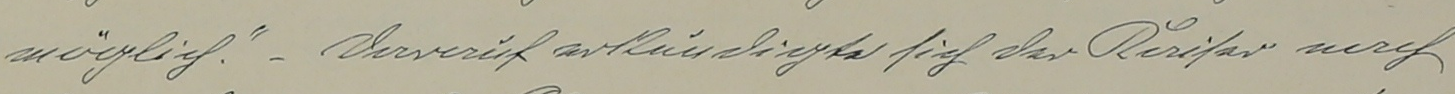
möglich.“ – Darauf erkundigte sich der Kaiser nach
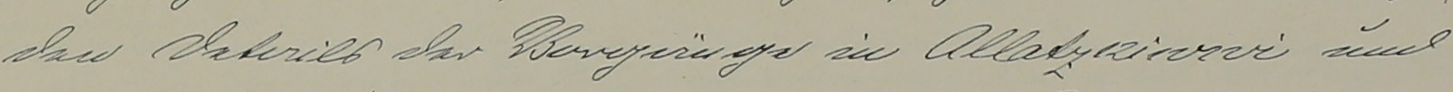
den Details der Vorgänge in Allatzkiwwi und
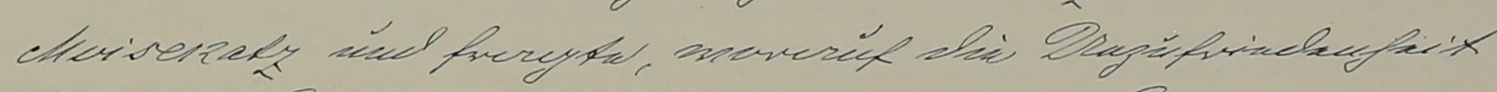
Moisekatz und fragte, worauf die Unzufriedenheit
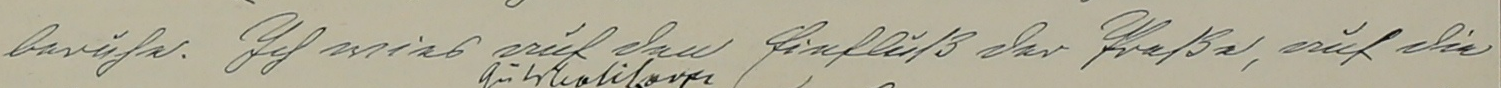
beruhe. Ich wies auf den Einfluß der Preße, auf die
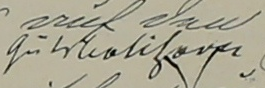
Gutsbesitzern
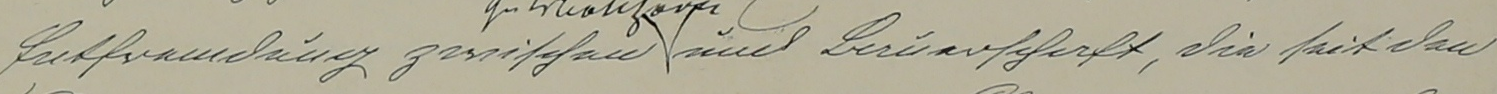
Entfremdung zwischen und Bauerschaft, die seit den
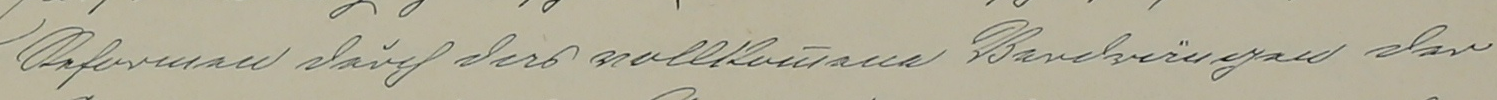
Reformen durch das vollkommene Verdrängen der
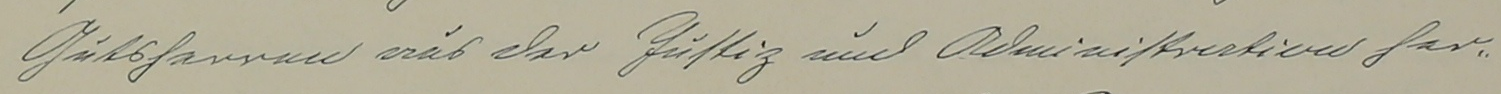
Gutsherren aus der Justiz und Administration her-
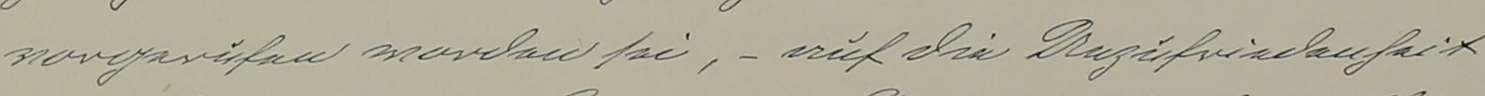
vorgerufen worden sei, - auf die Unzufriedenheit
